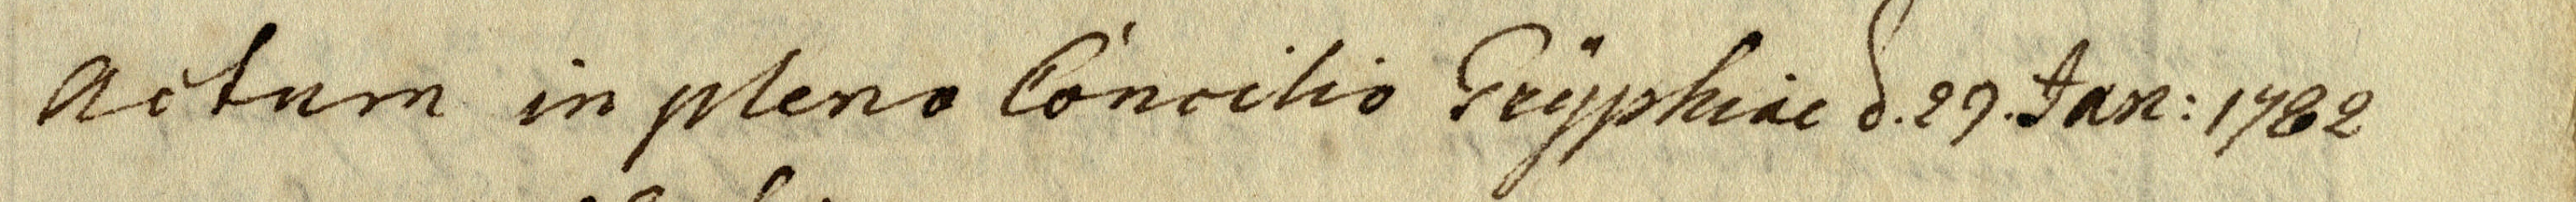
Actum in pleno Concilio Grÿphiae d. 29. Jan. 1782
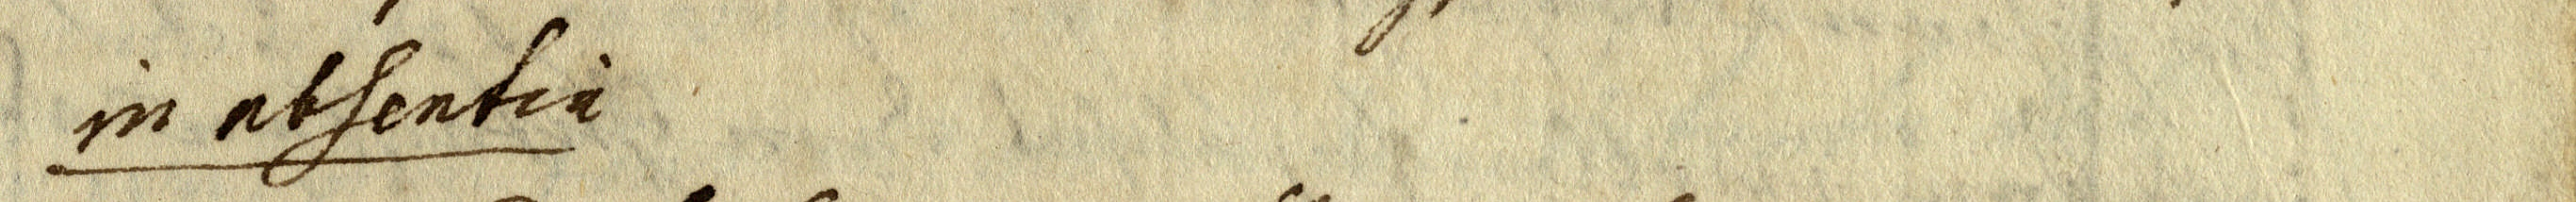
in absentia
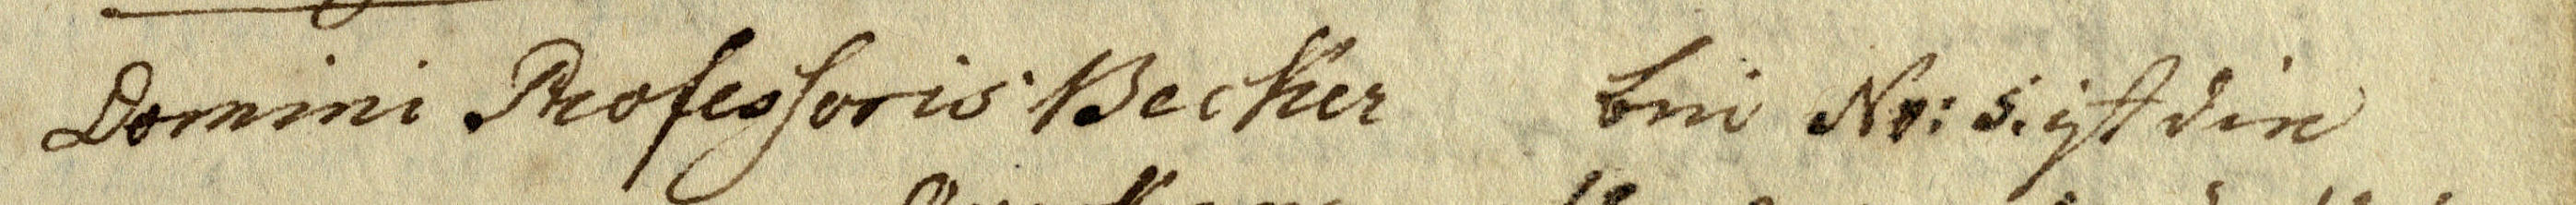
Domini Professoris Becker bei No 5. ist die
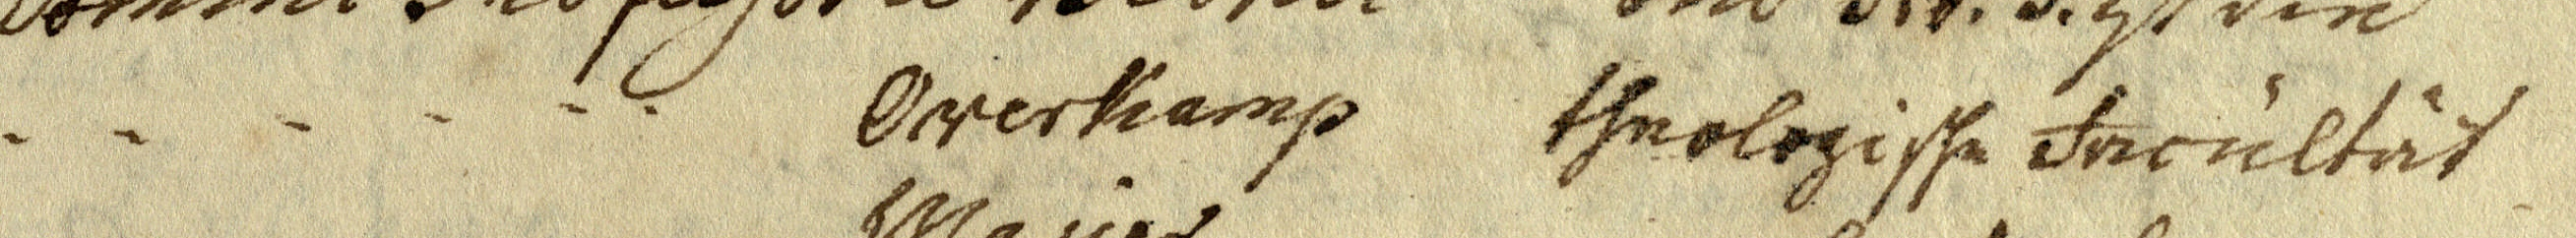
Overkamp theologische Facultät
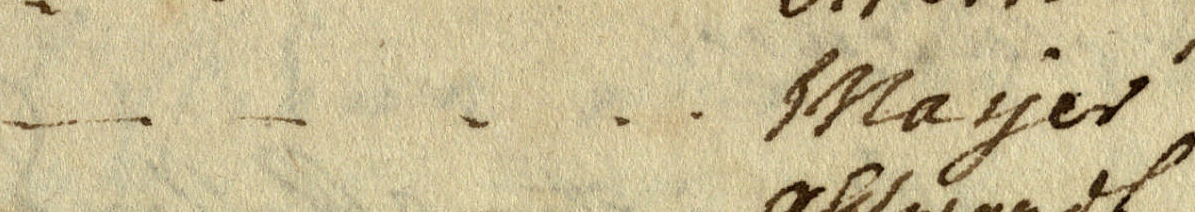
Maÿer abgetreten.
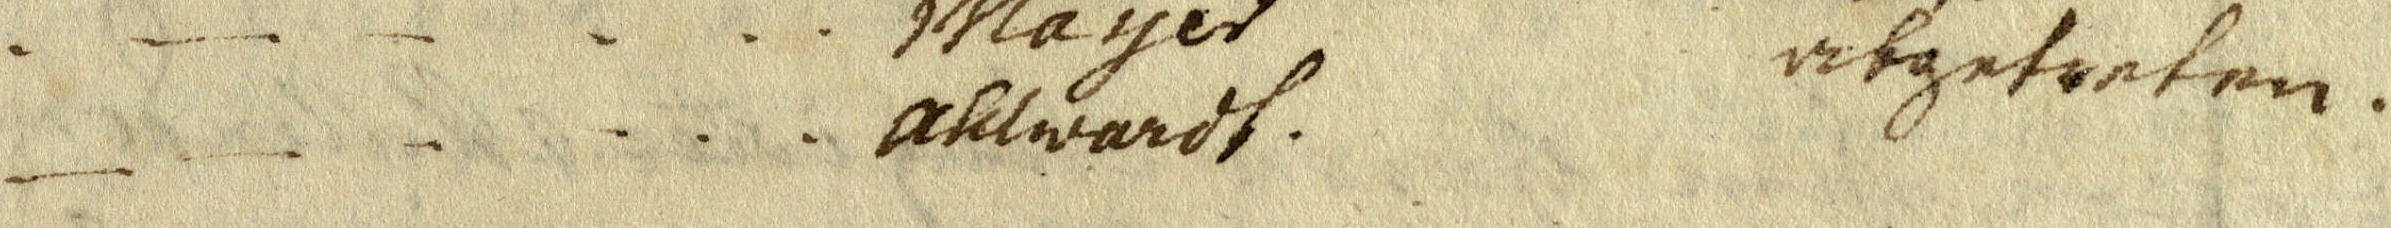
Ahlwardt.
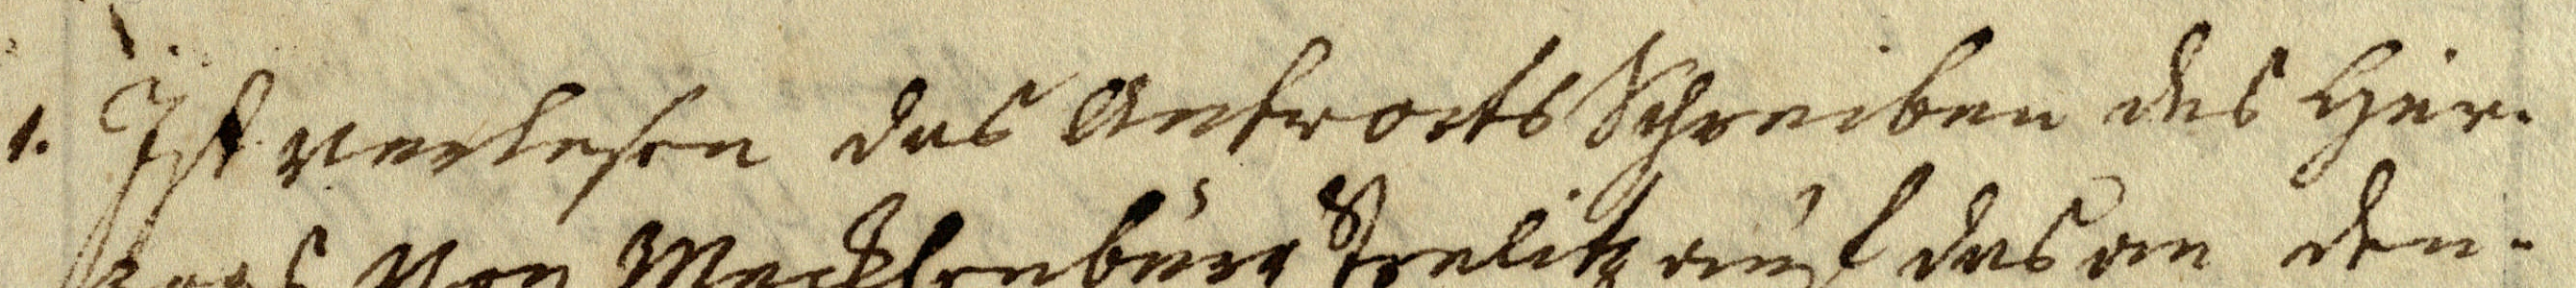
1. Ist verlesen das AntwortsSchreiben des Her¬
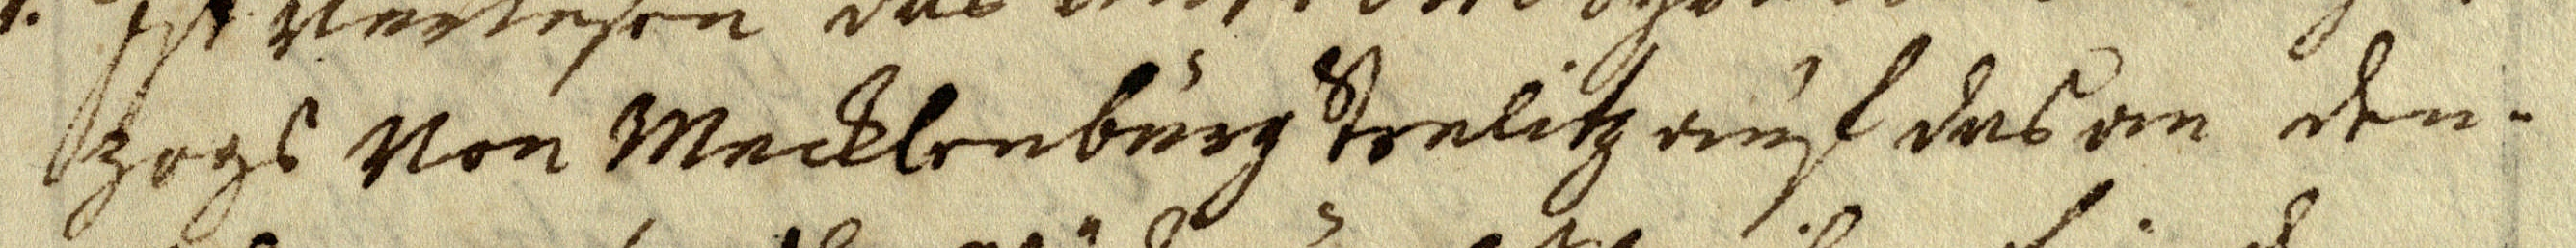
zogs von Mecklenburg Strelitz auf das an den¬
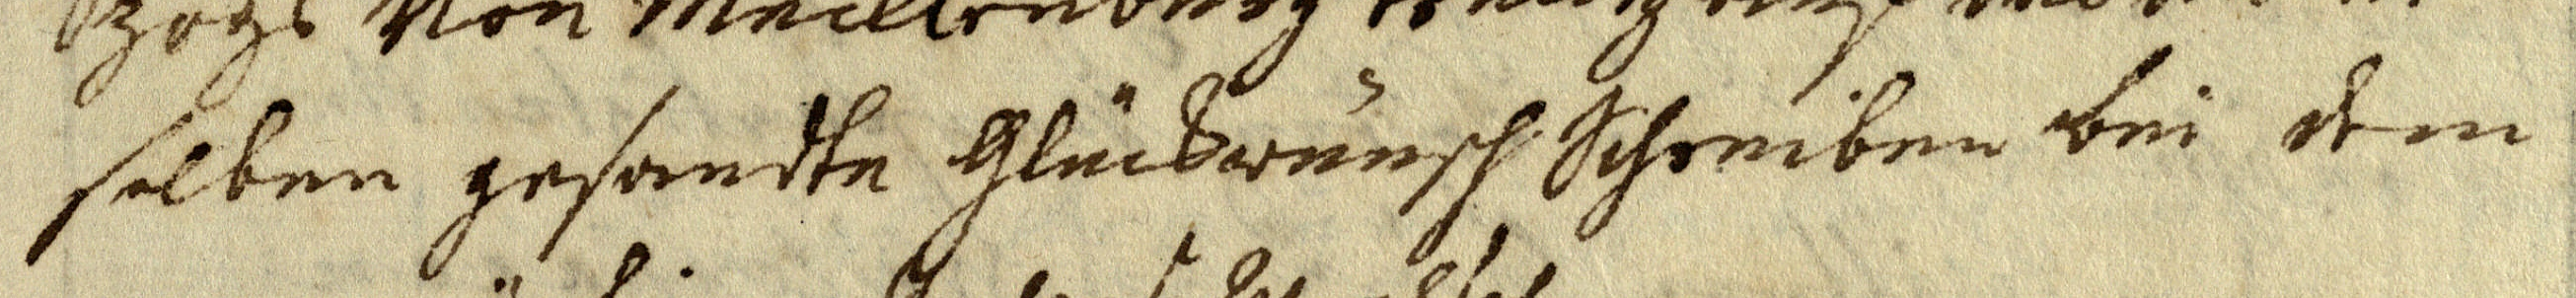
selben gesandte GlückwunschSchreiben bei dem
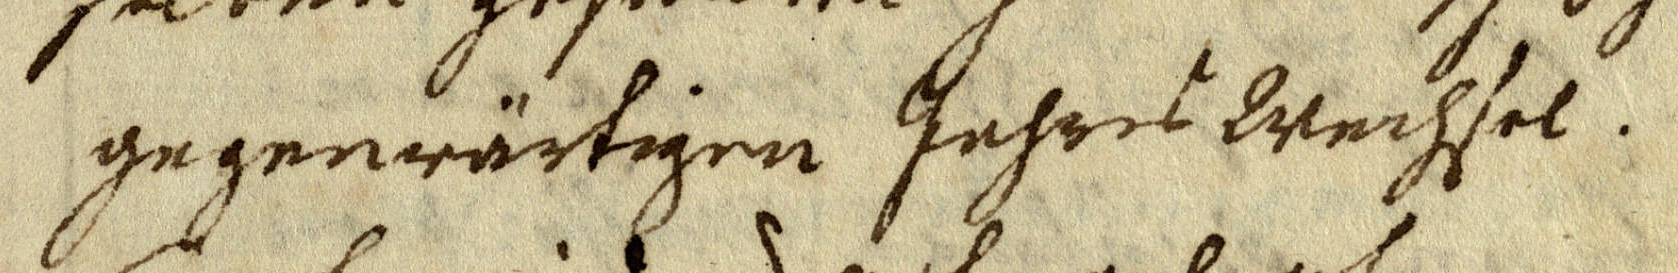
gegenwärtigen Jahres Wechsel.
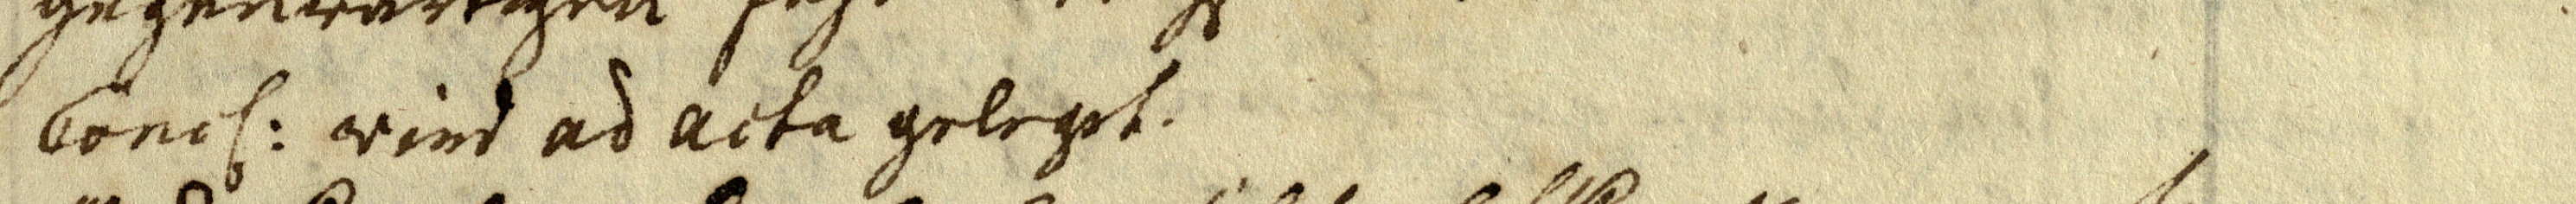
Concl. wir ad acta geleget.
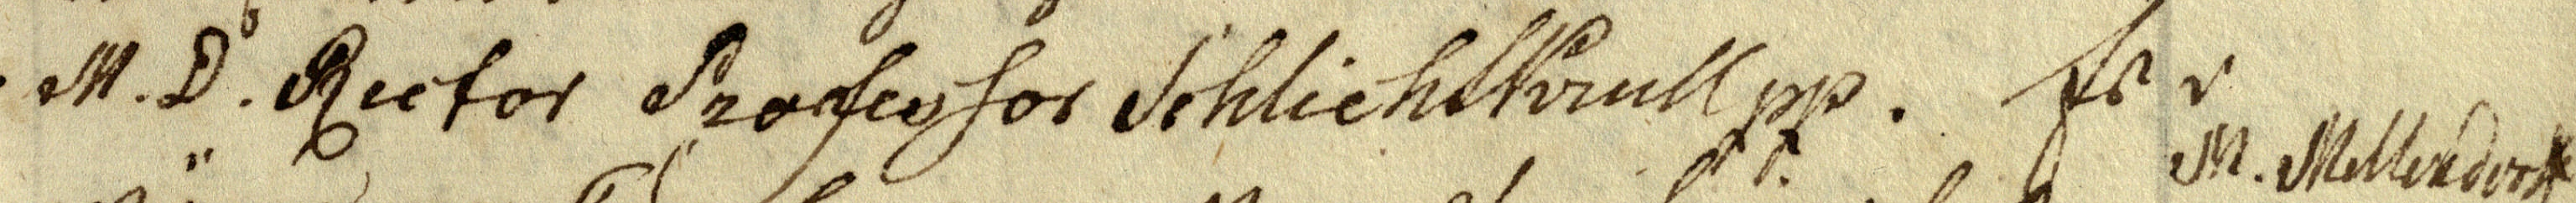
2. M. D. Rector Prof. Schlichtkrull pp. Es
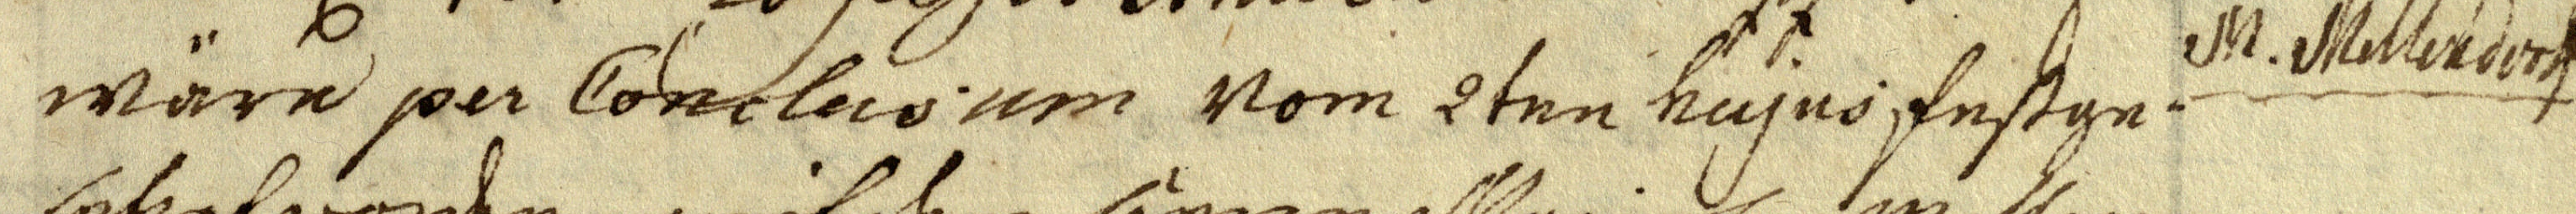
wäre per Conclusum vom 2ten hujus festge¬
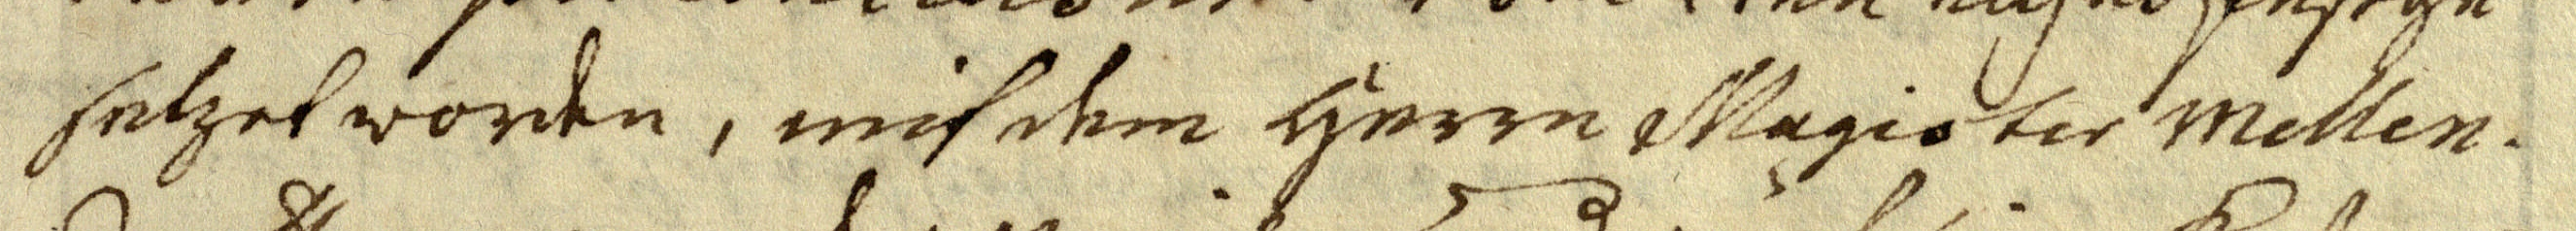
setzet worden, mit dem Herrn Magister Mellen¬
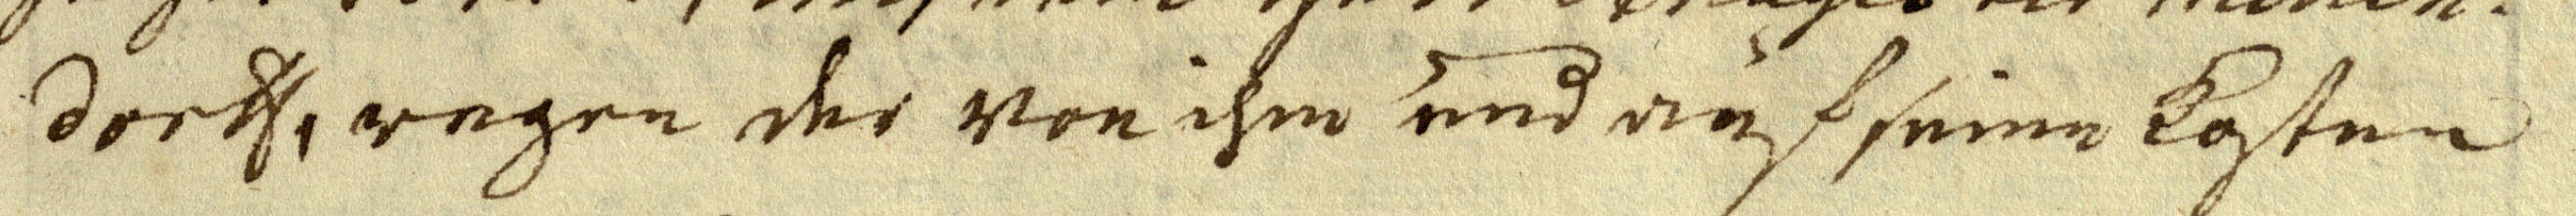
dorff, wegen der von ihm und auf seine Kosten
